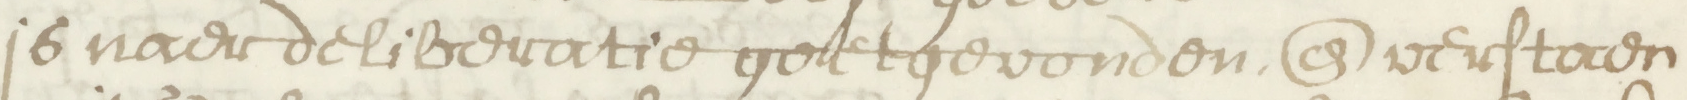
is naer deliberatie goetgevonden & verstaen,
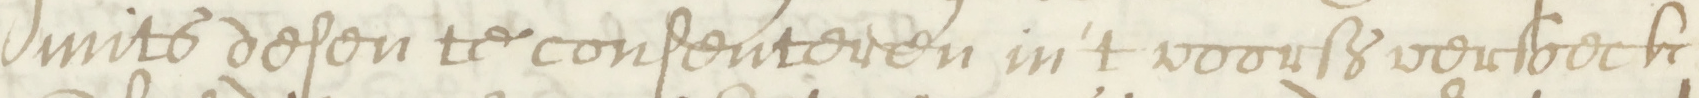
mits desen te consenteren in 't voors versoeck
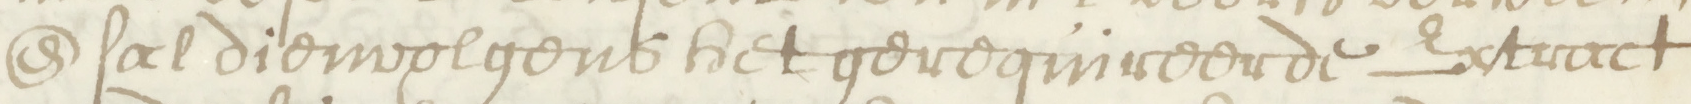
& sal dienvolgens het gerequireerde Extract
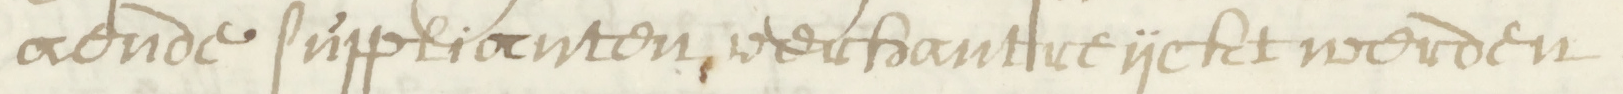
aende supplianten verhantreijckt werden,
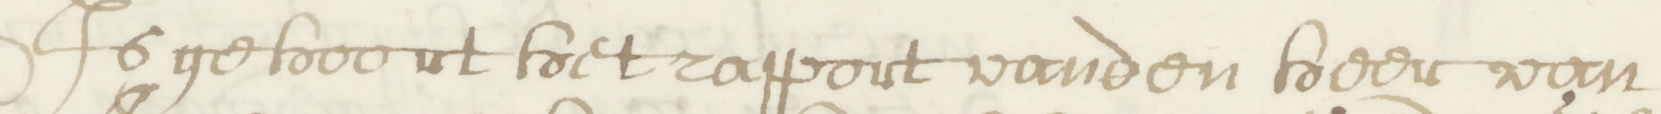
Is gehoort het rapport van den heer van
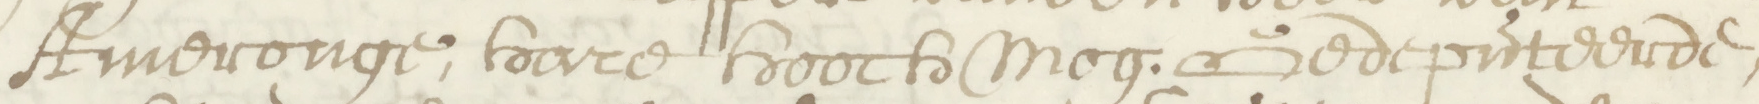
Ameronge, hare hooch Mog. Gedeputeerde,
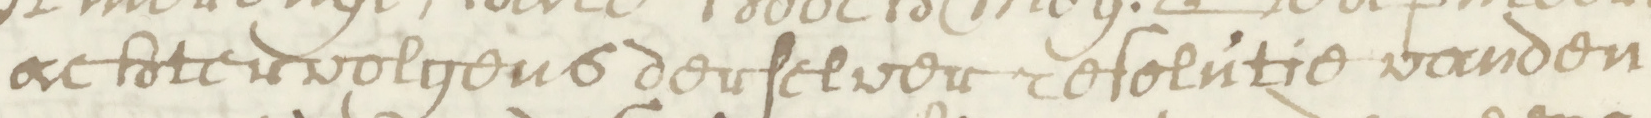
achtervolgens derselver resolutie vanden
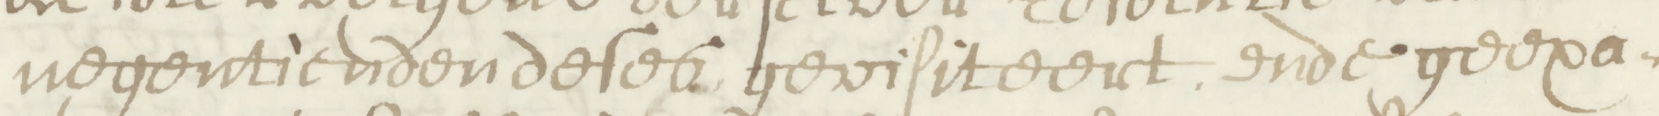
negentienden deses gevisiteert, ende geexa„
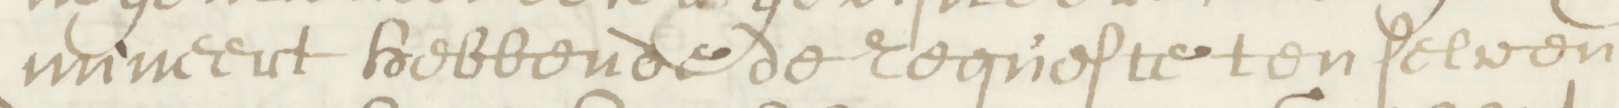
mineert hebbende de requeste ten selven
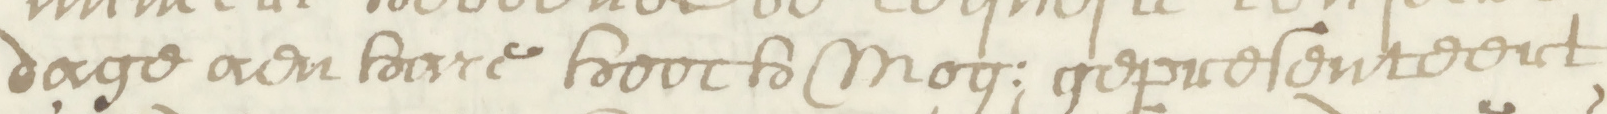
dage aen hare hooch Mog: gepresenteert,
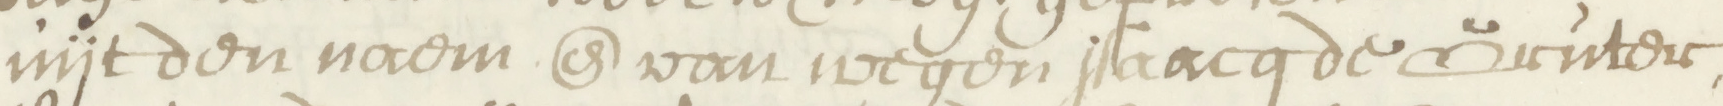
uijt den naem & van wegen Isaacq de Gruter,
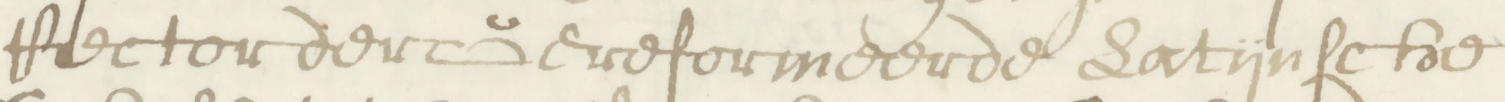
Rector der Gereformeerde Latijnsche
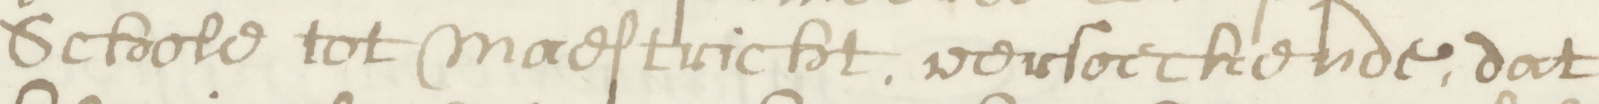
Schole tot maestricht, versoeckende, dat
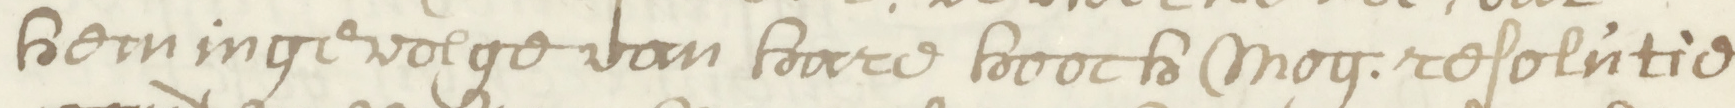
hem ingevolge van hare hooch Mog: resolutie
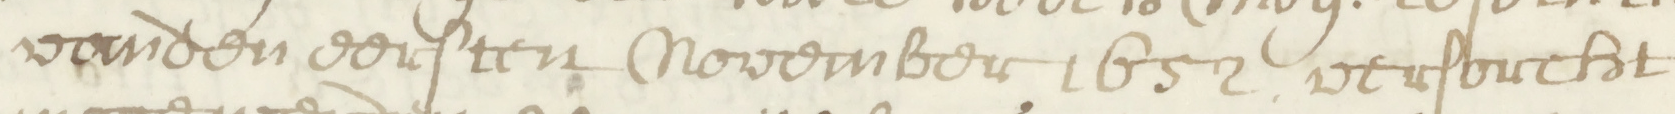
vanden eersten November 1652. versorcht
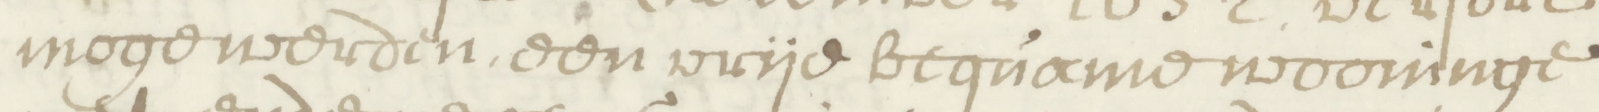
moge werden, een vrije bequame wooninge
